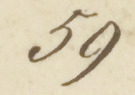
59
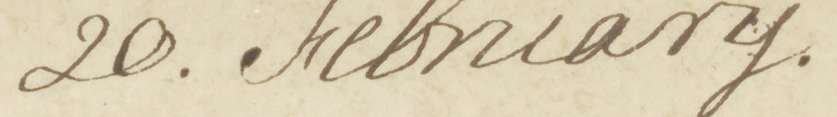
20. Februarij.
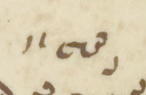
,, ce
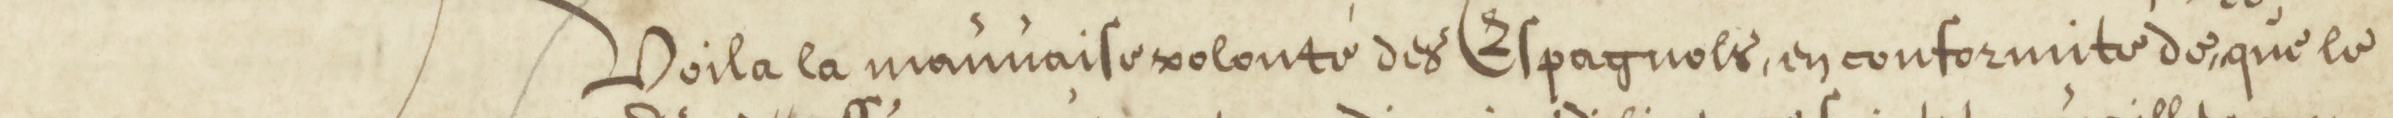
Voila la mauuaise volonté des Espagnols, en conformité de,,que le
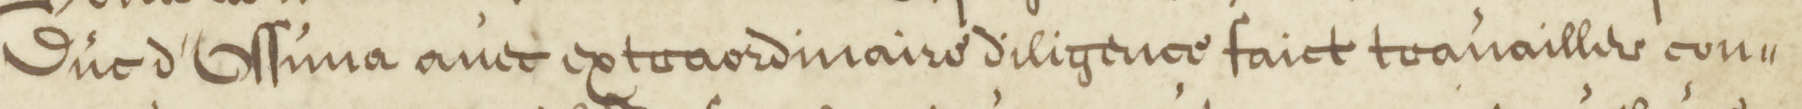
Duc d‛Ossuna auec extraordinaire diligence faict trauaillee con„
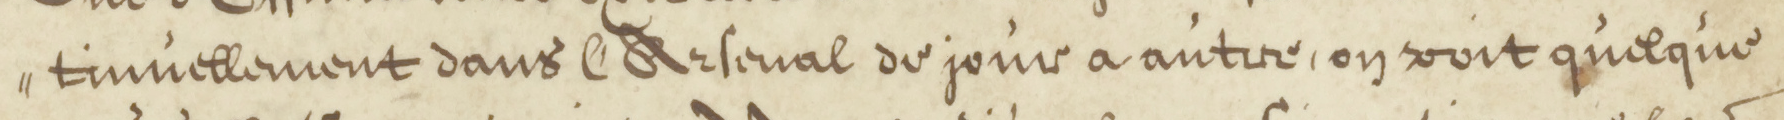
„tinuellement dans l‛Arsenal de jour a autre, on voit quelque
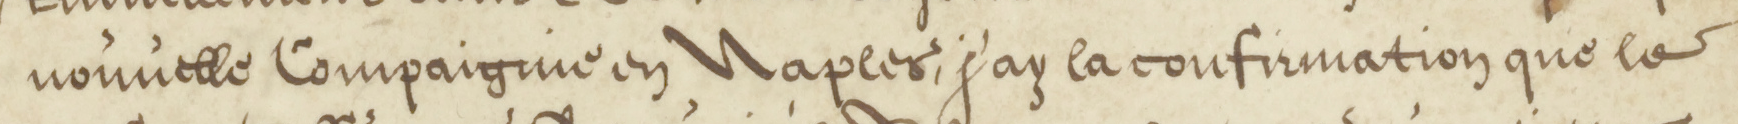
nouuelle Compaignie en Naples, j‛ay la confirmation que le
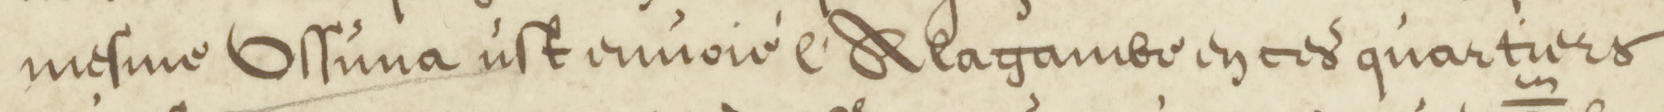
mesme Ossuna ust enuoié l‛Alagambe en ces quartiers
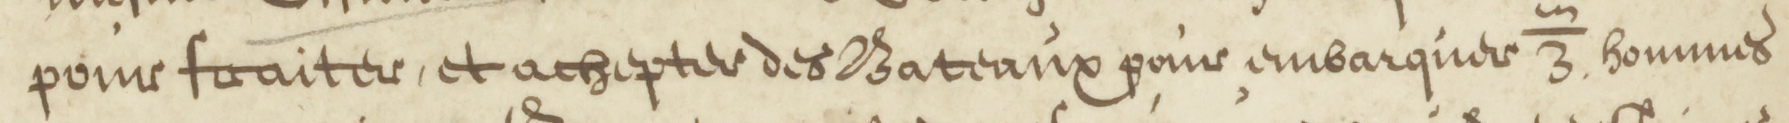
pour fraiter, et achepter des Bateaux pour embarquer 3M hommes
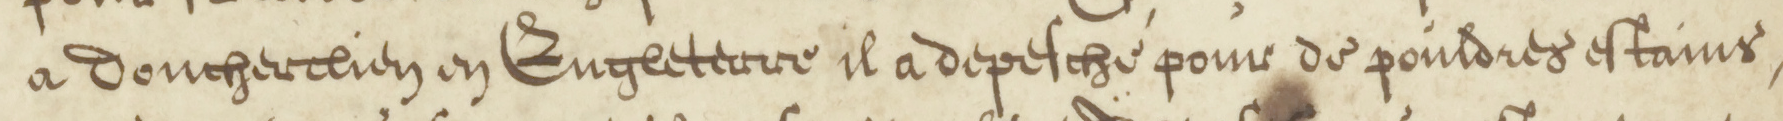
a Doncherclien en Engleterre il a depesché pour de pouldres estains,
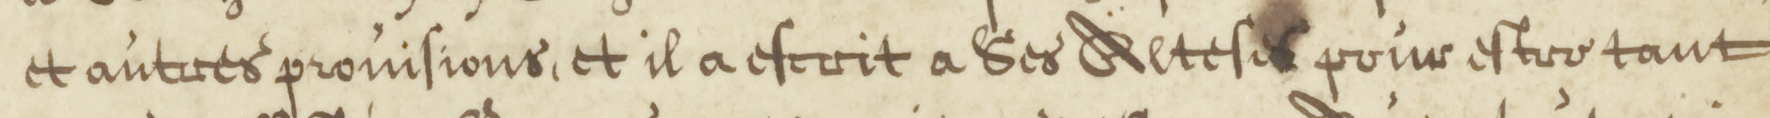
et autres prouisions, et il a escrit a Ses Alteses pour estre tant
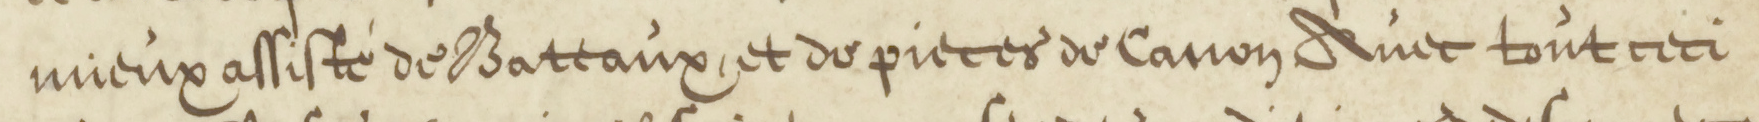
mieux assisté de Bateauq, et de pieces de Canon Auec tout ceci
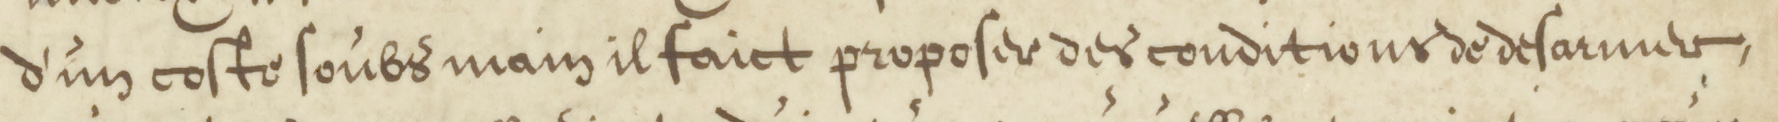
d‛un coste soubs main il faict proposer des conditions de desarmer,
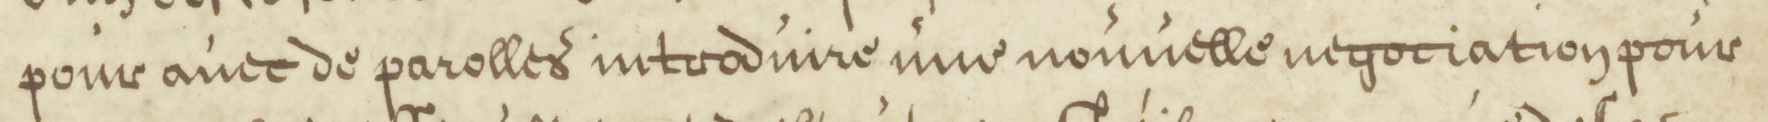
pour auec de parolles introduire une nouuelle negociation pour
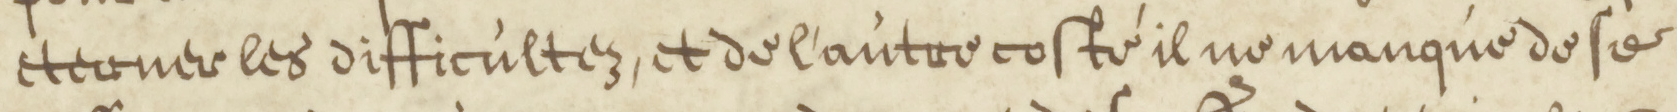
eterner les difficultez, et de l‛autre costé il ne manque de se
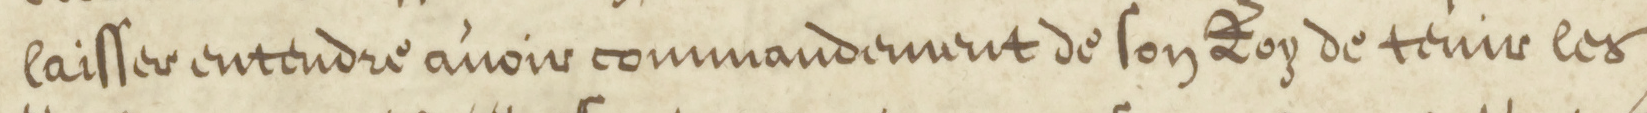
laisser entendre auoir commandement de son Roy de tenir les
